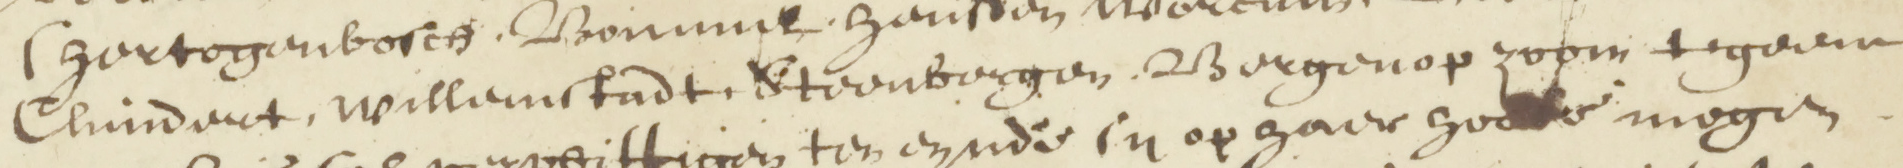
Clundert, Willemstadt, Steenbergen, Bergen op zoom t'geen
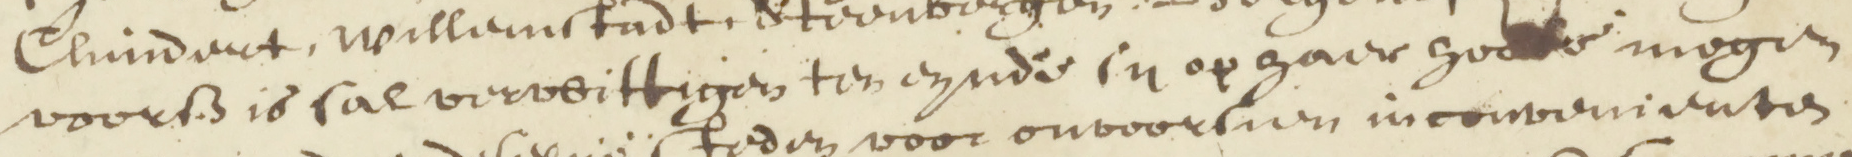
voors is sal verwittigen ten eynde sy op haer hoede mogen
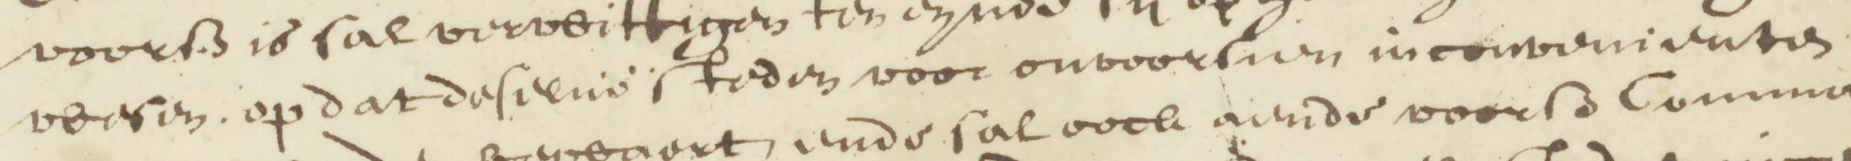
wesen, op dat deselue steden voor onvoorsien inconvenienten
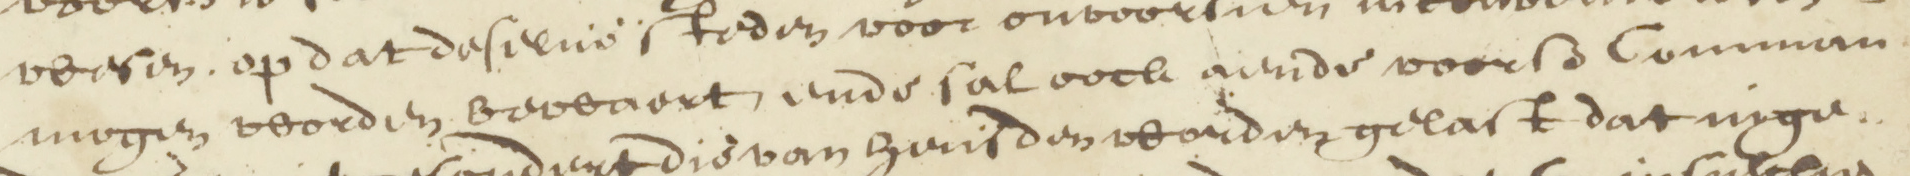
mogen worden bewaert, ende sal oock aende voors Comman
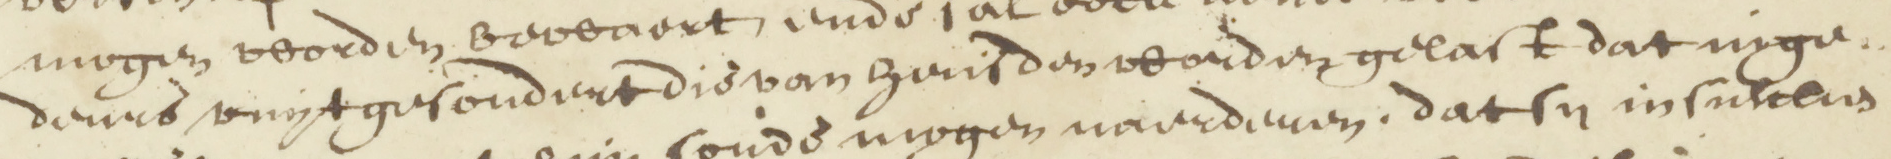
deurs vuytgesondert die van heusden worden gelast dat inge„
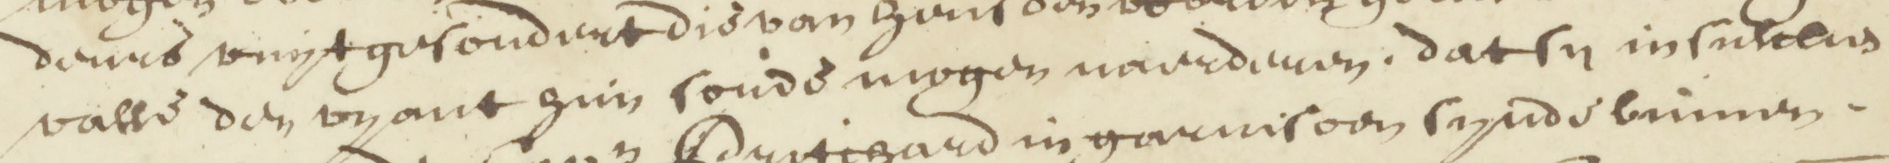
valle den vyant hun soude mogen naerderen, dat sy in sulcken
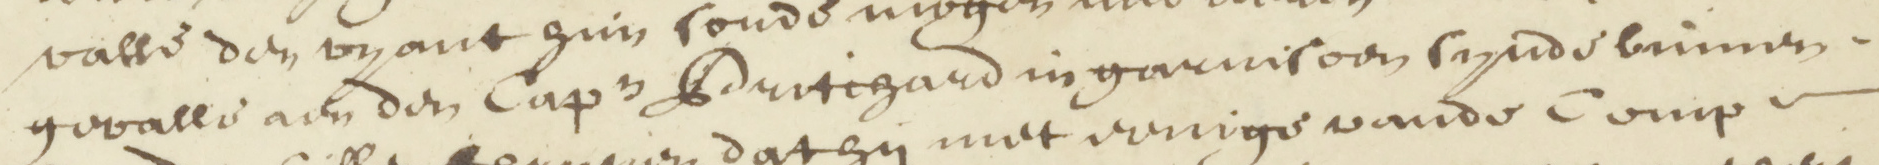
gevalle aen den Capn Pritchard in garnisoen synde binnen
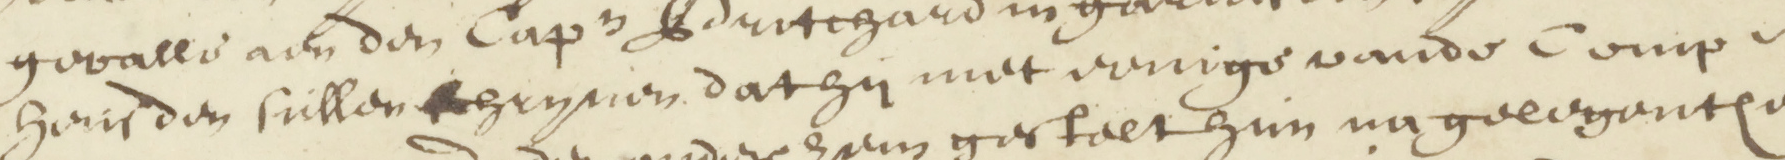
heusden sullen schryuen dat hy met eenige vande Compe
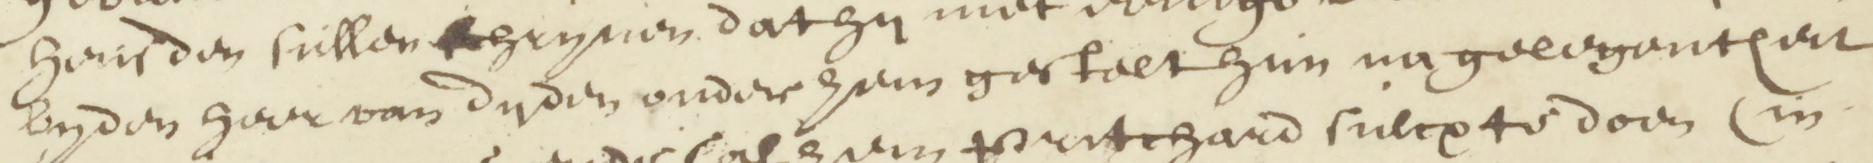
byden heer van dyden onder hem gestelt hun na gelegentheit
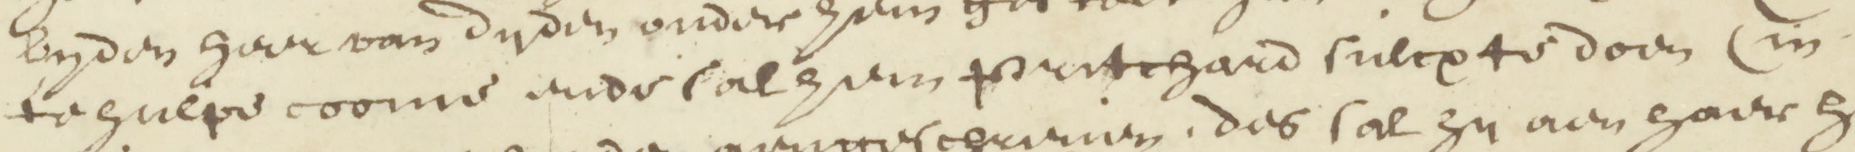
te hulpe coome ende sal hem Pritchard sulcx te doen (in
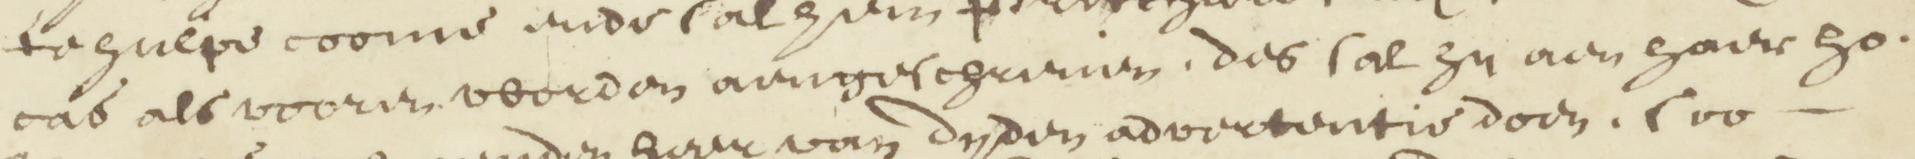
cas als vooren worden aengeschreuen, des sal hy aen haer Ho:
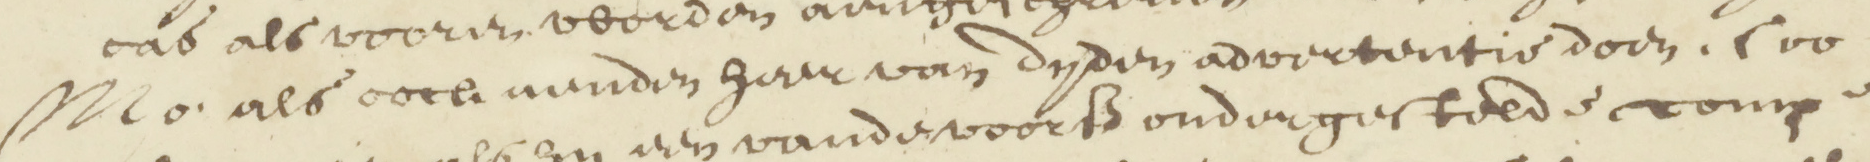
Mo: als oock aenden heer van dyden advertentie doen, soo
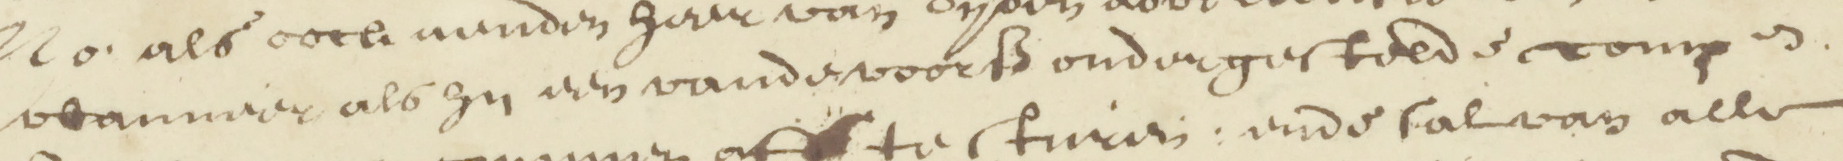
wanneer als hy een vande voors ondergestelde compen.
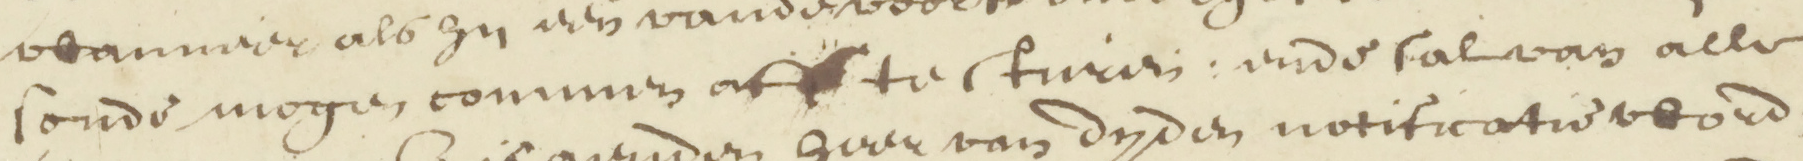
soude mogen commen aff te sturen, ende sal van alle
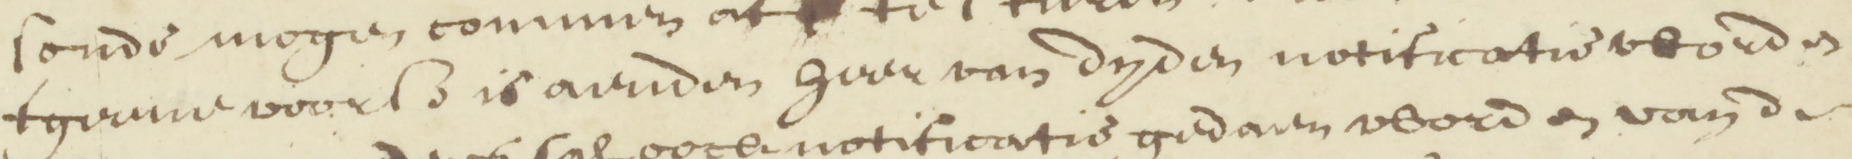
tgeene voors is aenden heer van dyden notificatie worden
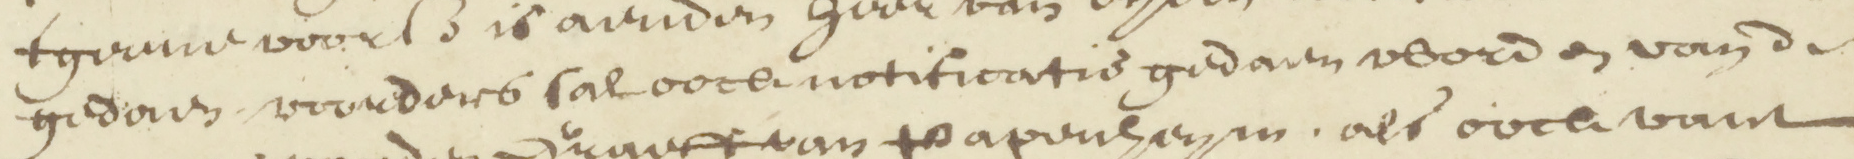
gedaen. voorders sal oock notificatie gedaen worden van de
